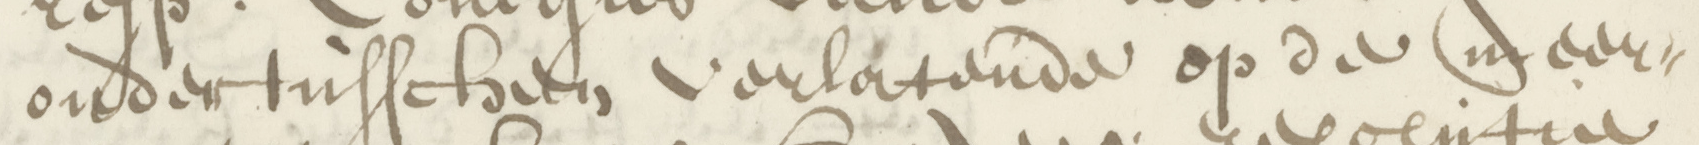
ondertusschen verlatende op de meer„
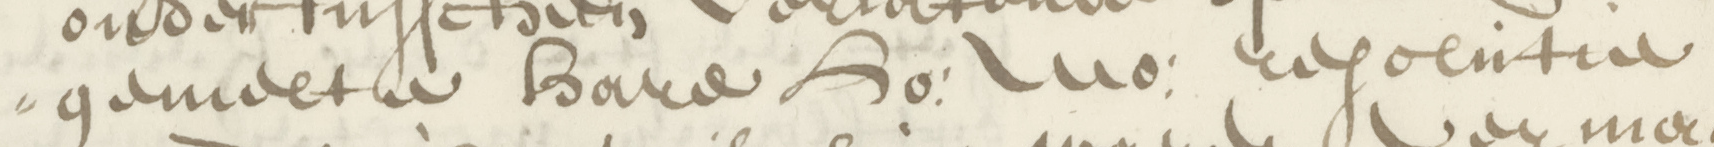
gemelte haer Ho:Mo: resolutie
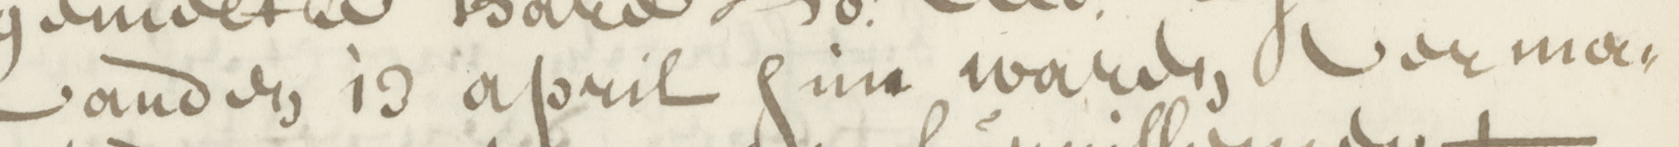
vanden 13 april hun waren verma„
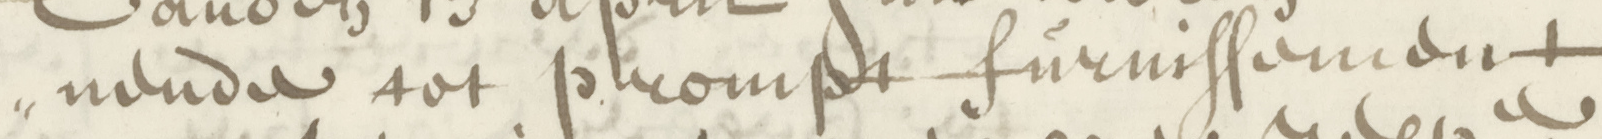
nende tot prompt furnissement
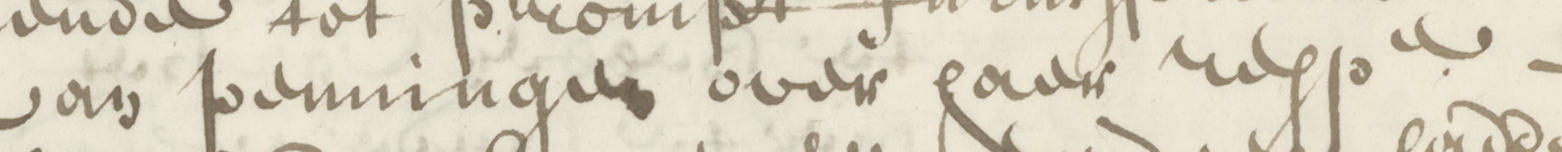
van penningen over haer respe
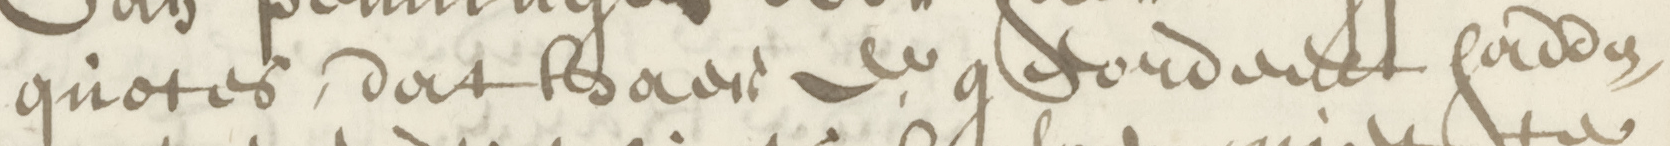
quotes dat haer E. geordeelt hadden,
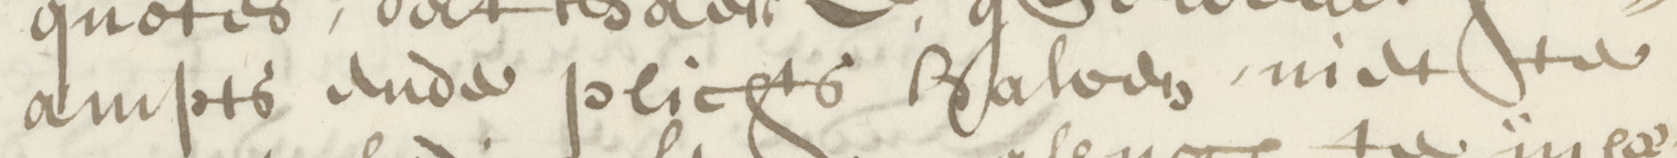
ampts ende plichts halven, niet te
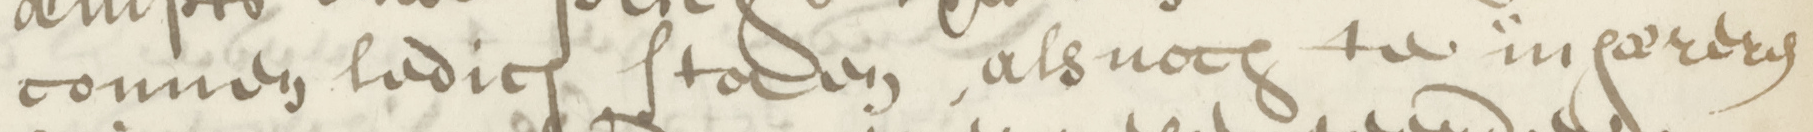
connen ledich staen, als noch te inhæreren
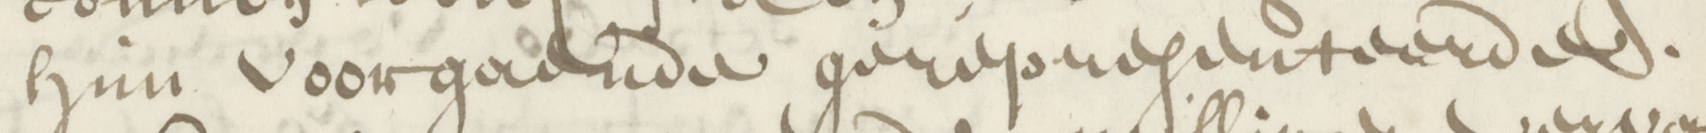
hun voorgaende gerepresenteerde,
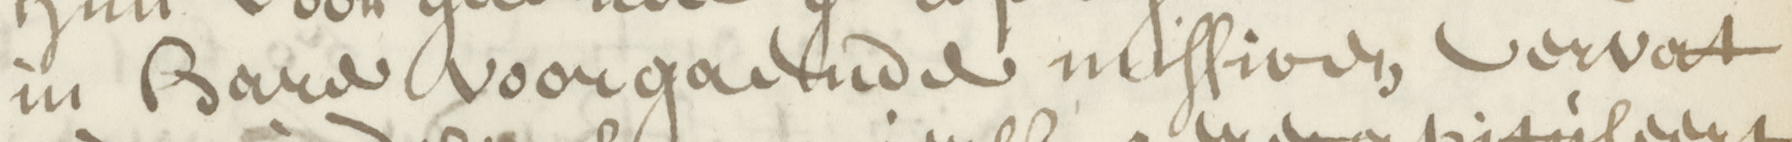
in hare voorgaende missiven vervat
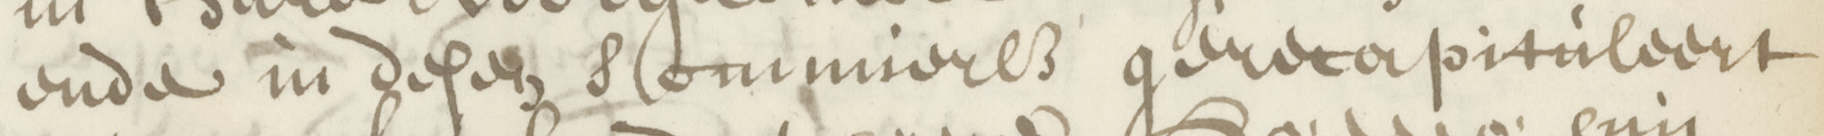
ende in desen sommierl gerecapituleert
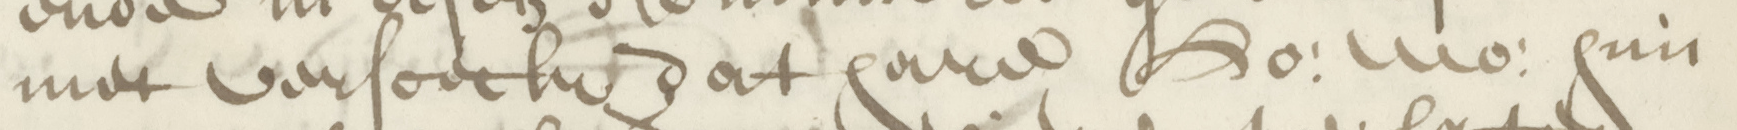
met versoeck dat haer Ho:Mo: hun
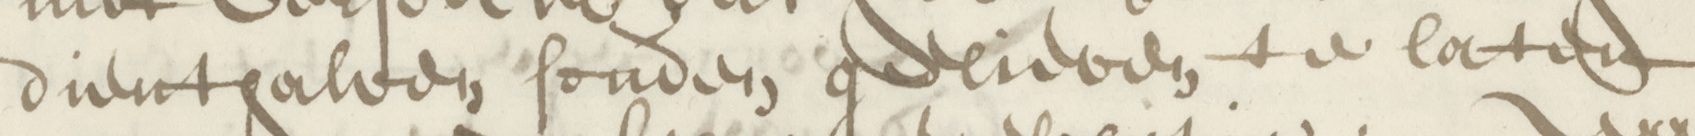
dienthalven souden gelieven te laten
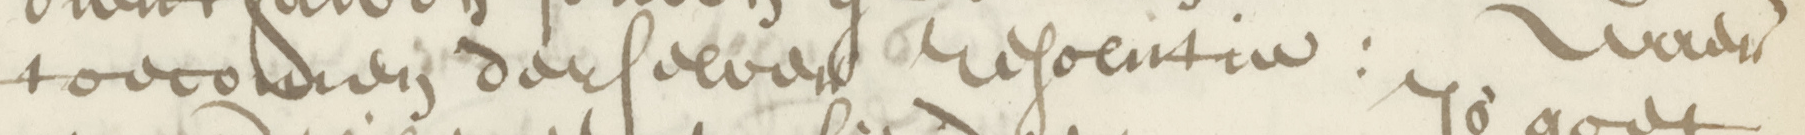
toecomen derselven resolutie: Waer
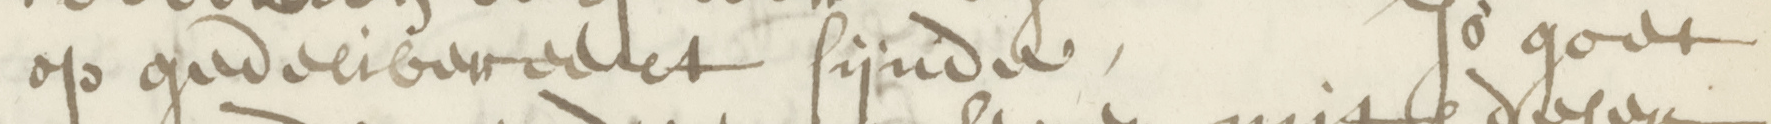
op gedelibereert sijnde, Is goet
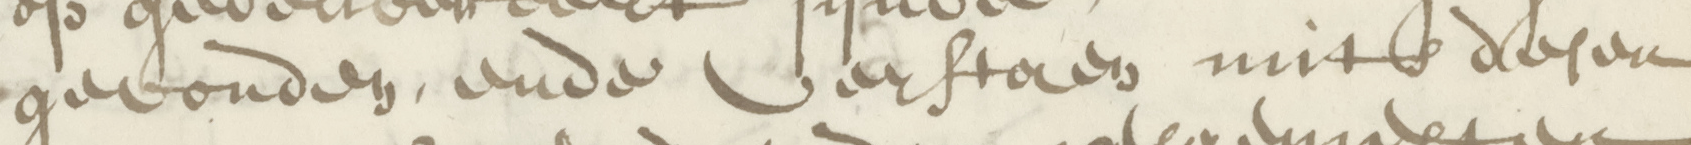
gevonden, ende verstaen mits desen
